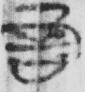言
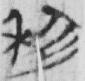利（利）
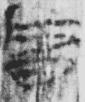○（詞）
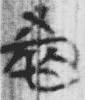者
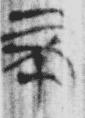不
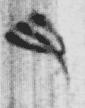又
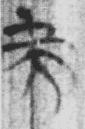夫
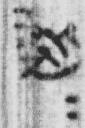詘詘
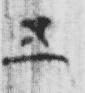之
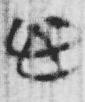心
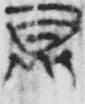鼎（則）
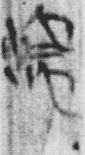○（流）
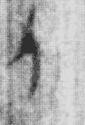人
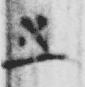之
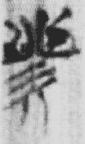{卯糸}（悅）
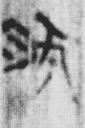肰（然）
